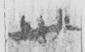卅
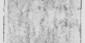二
